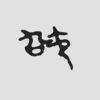{叴欠}
